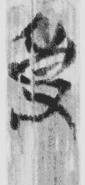事
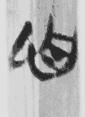首
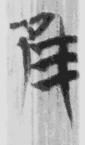隹
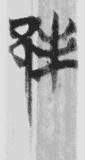邦
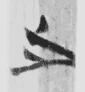之
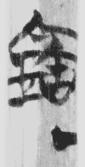{宀玉缶}
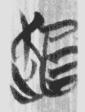𧻚
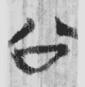公
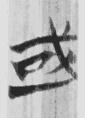或
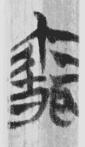{尒䎽}
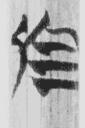於
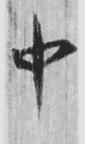中
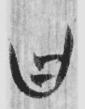曰
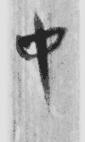中
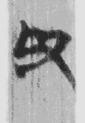父
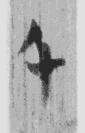千
